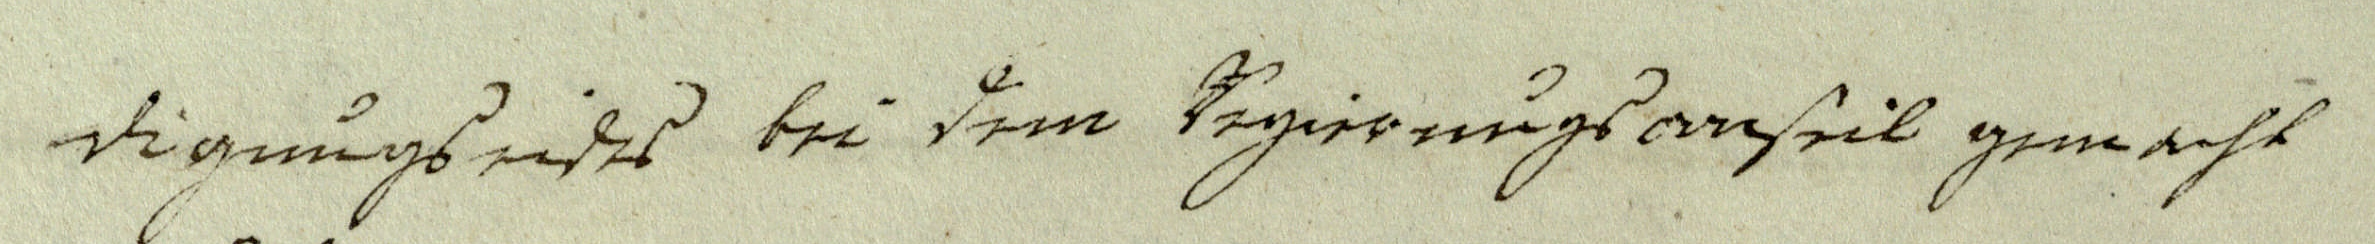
digungseides bei dem Regierungsconseil gemacht
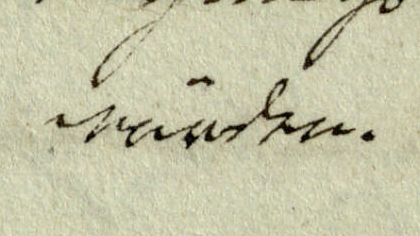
würden.
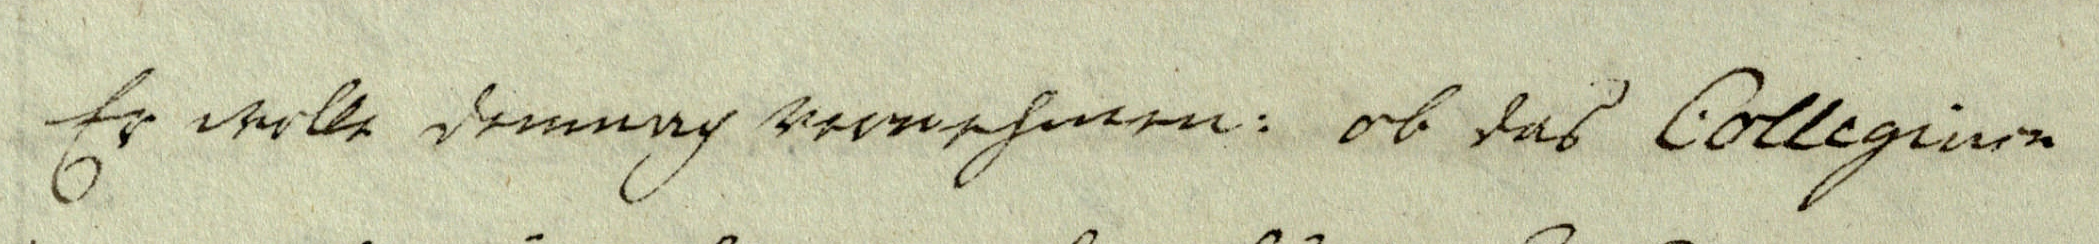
Er wolle demnach vernehmen: ob das Collegium
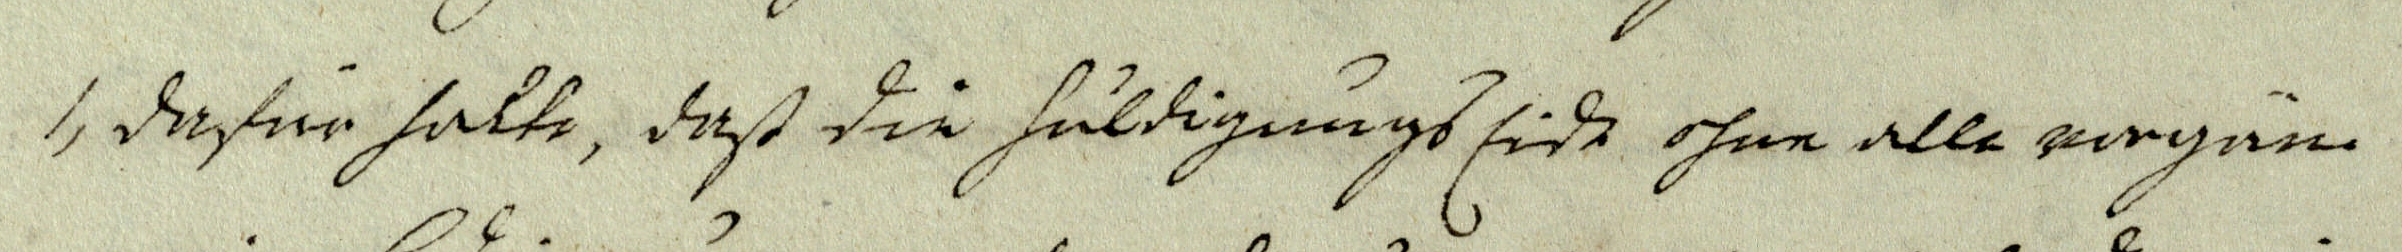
1, dafür halte, daß die Huldigungs Eide ohne alle vorgän¬
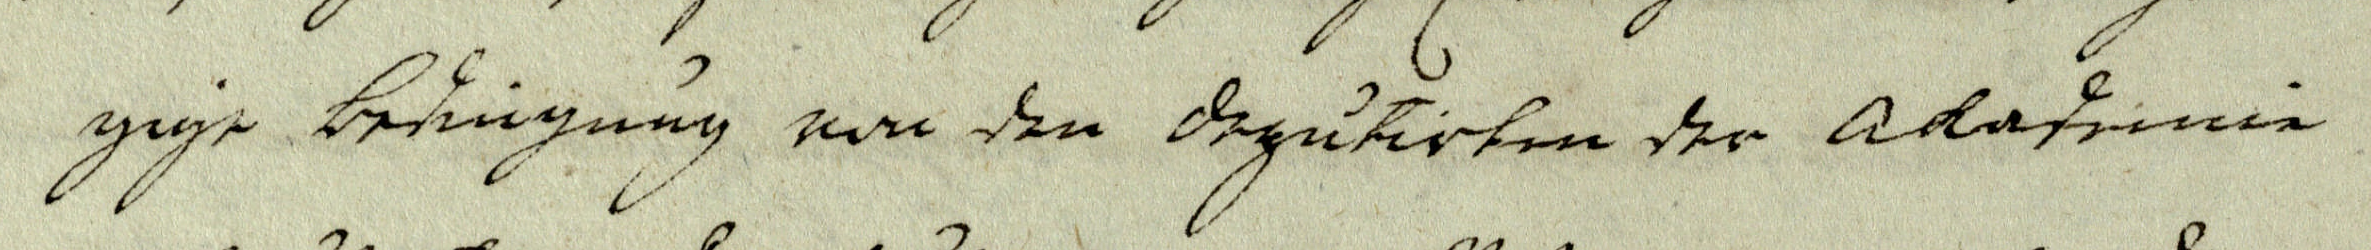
gige Bedingung von den Deputirten der Akademie
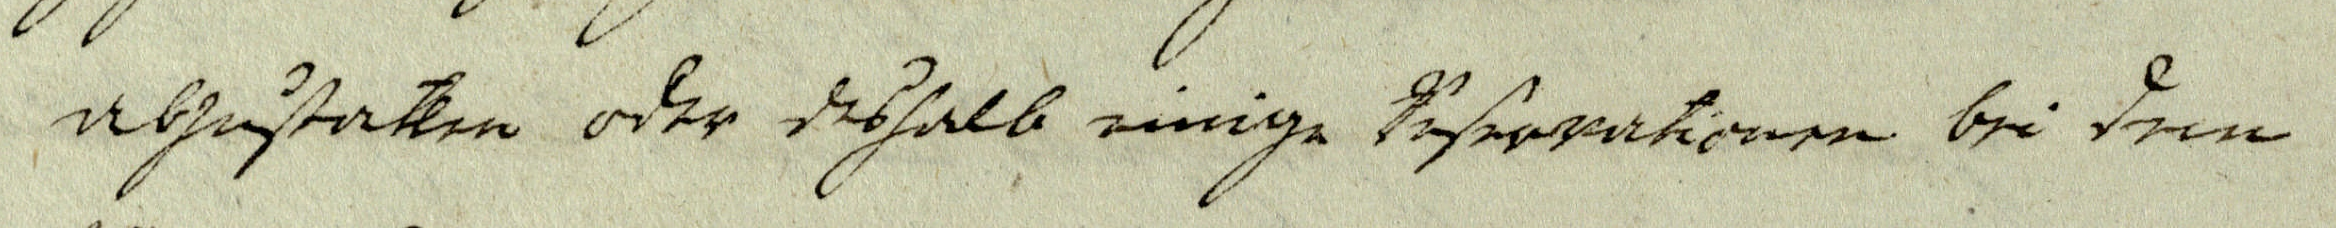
abzustatten oder deshalb einige Reservationen bei dem
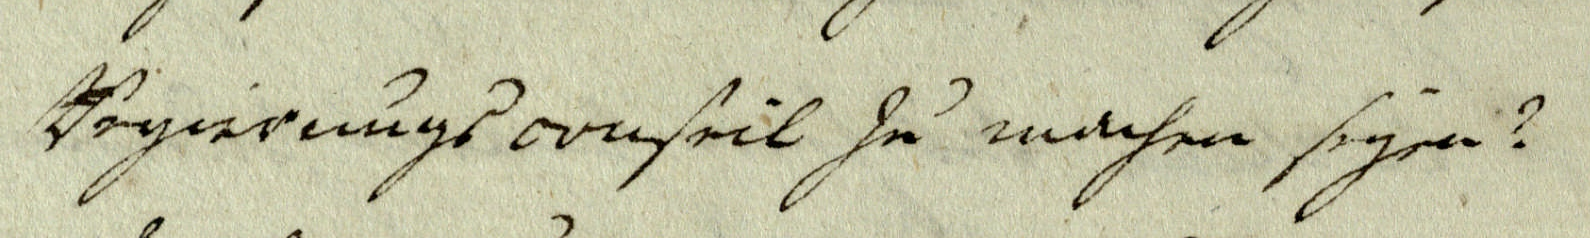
Regierungsconseil zu machen seÿen?
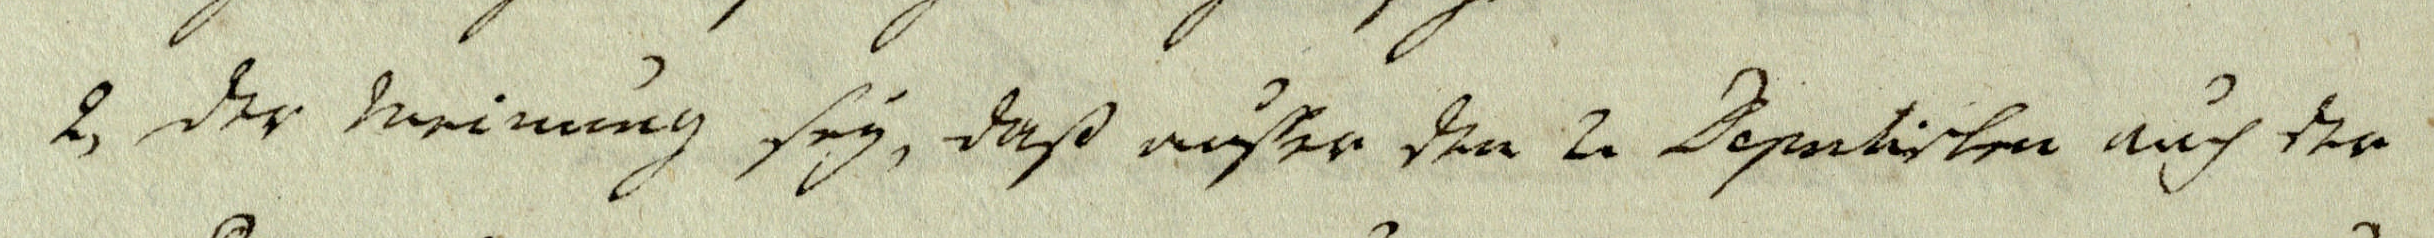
2, der Meinung seÿ, daß ausser den 2. Deputirten auch der
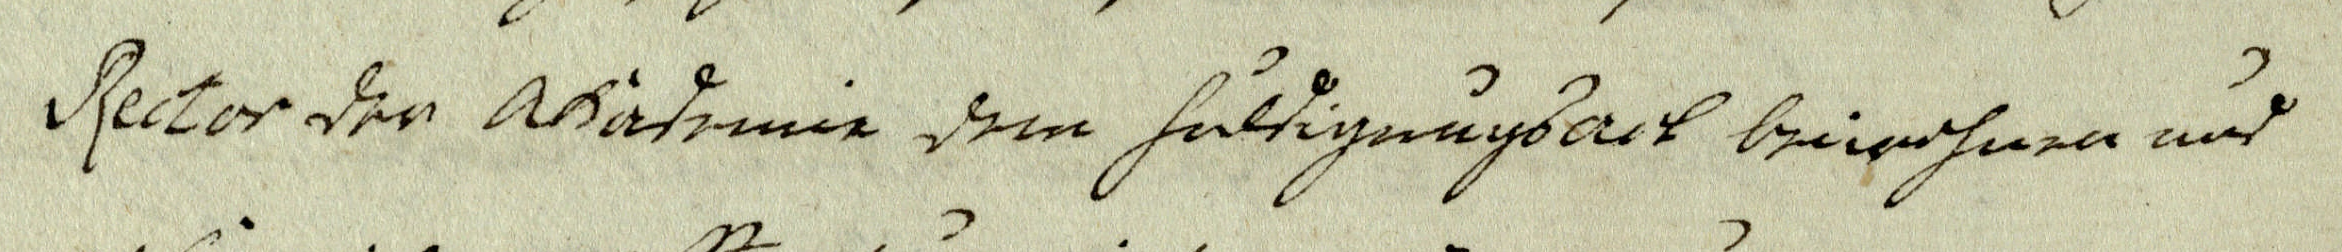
Rector der Akademie dem Huldigungsact beiwohnen und
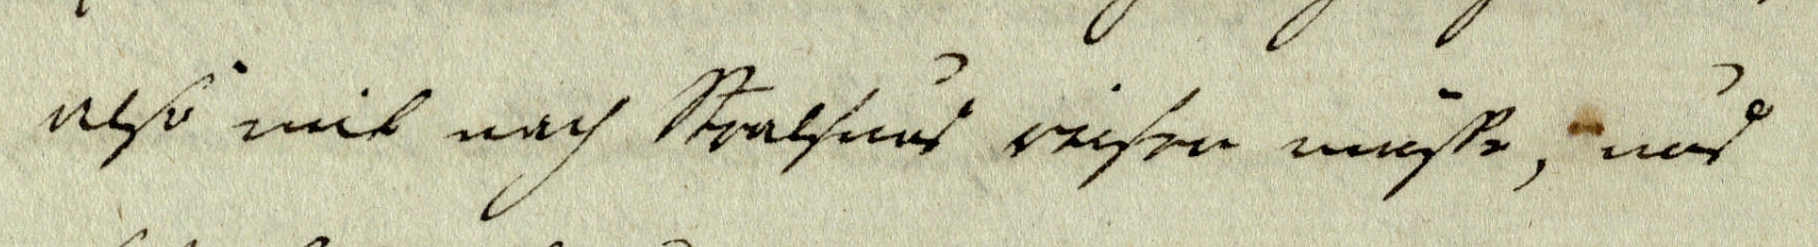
also mit nach Stralsund reisen müsse, und
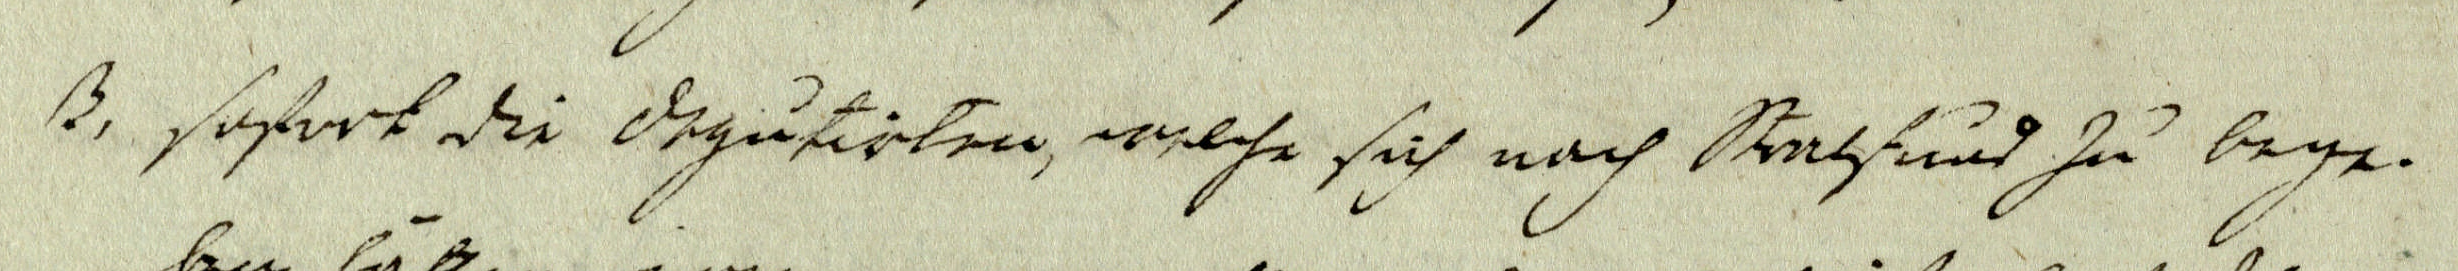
3, sofort die Deputirten, welche sich nach Stralsund zu bege¬
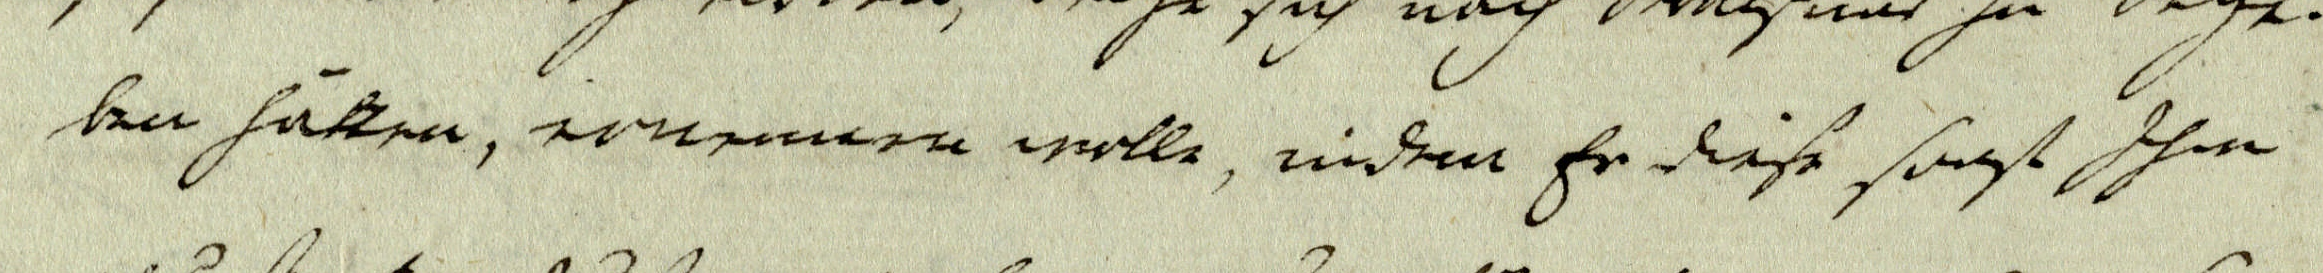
ben hätten, ernennen wolle, indem Er diese sonst Ihm
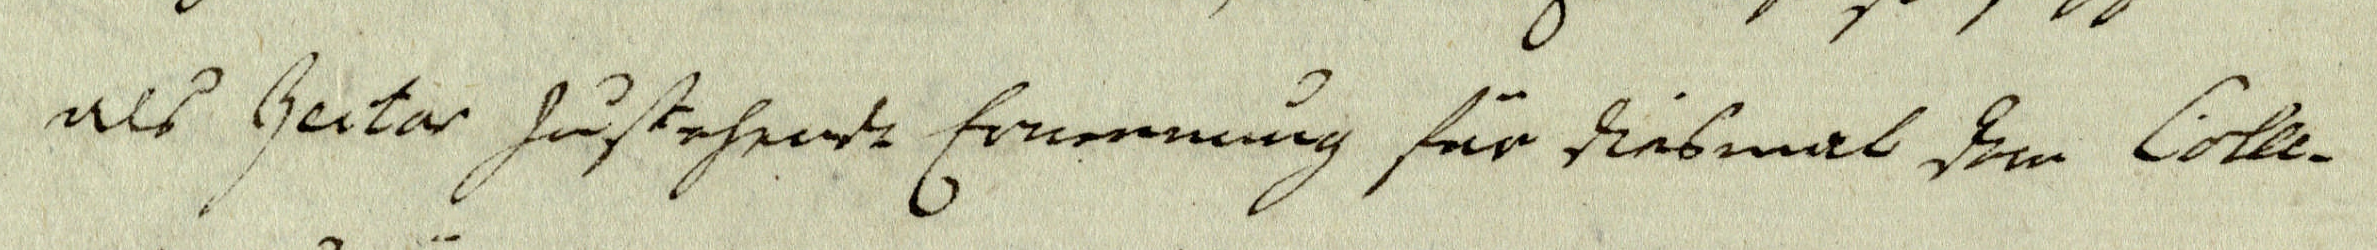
als Rector zustehende Ernennung für diesmal dem Colle¬
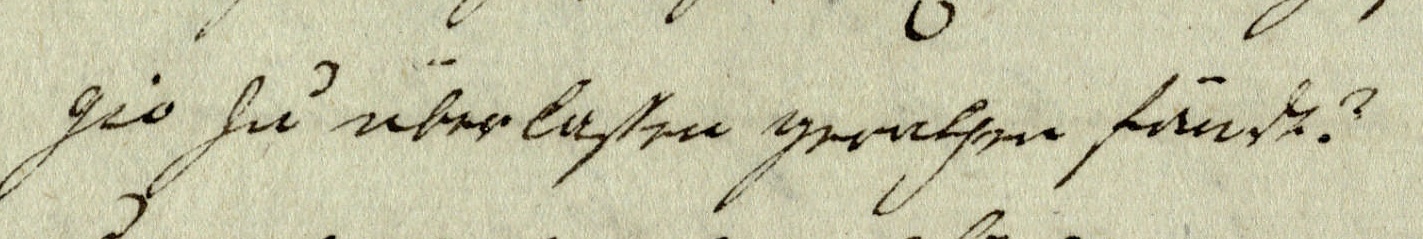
gio zu überlassen gerathen fände?
